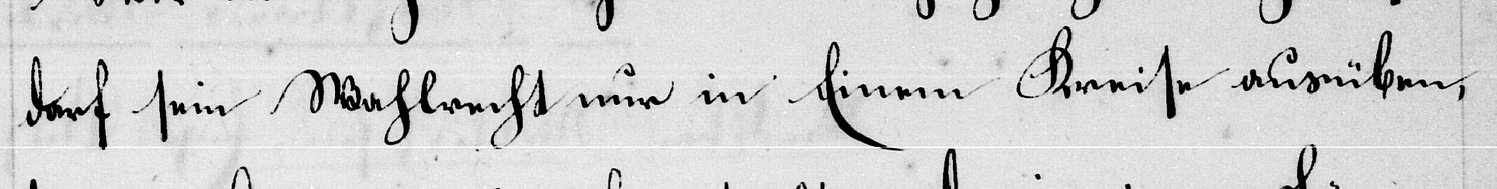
darf sein Wahlrecht nur in Einem Kreise ausüben,
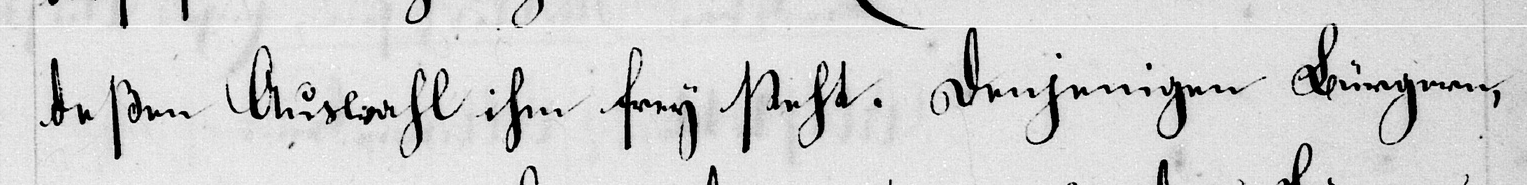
deßen Auswahl ihm frey steht. Denjenigen Bürgern,
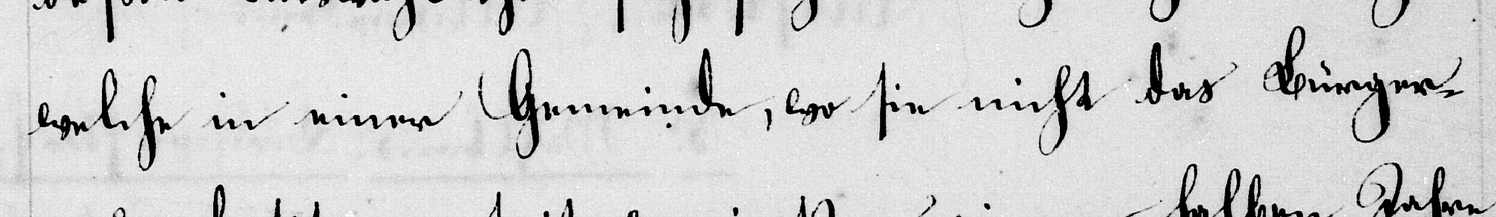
welche in einer Gemeinde, wo sie nicht das Bürger¬
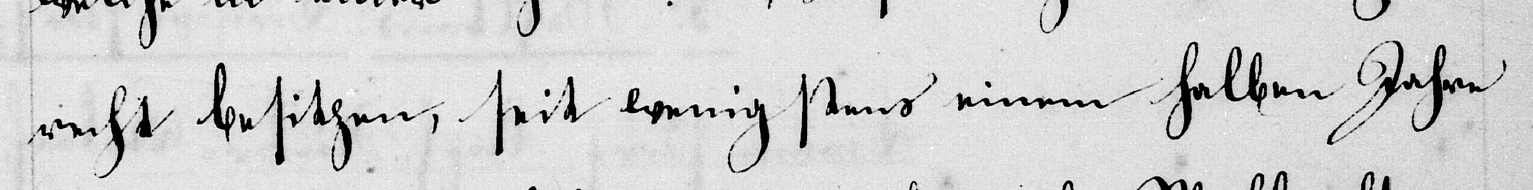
reicht besitzen, seit wenigstens einem halben Jahre
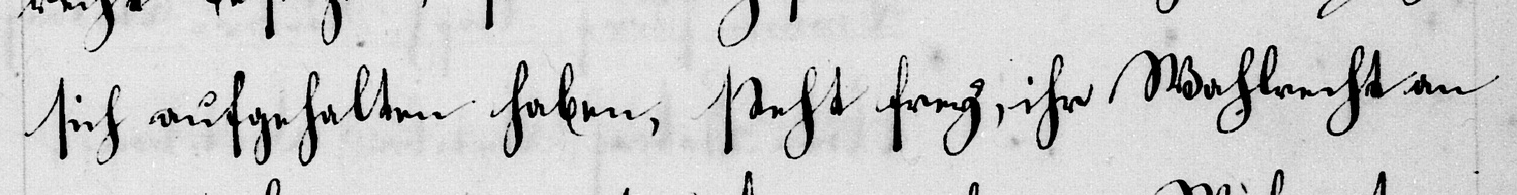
sich aufgehalten haben, steht frey, ihr Wahlrecht an
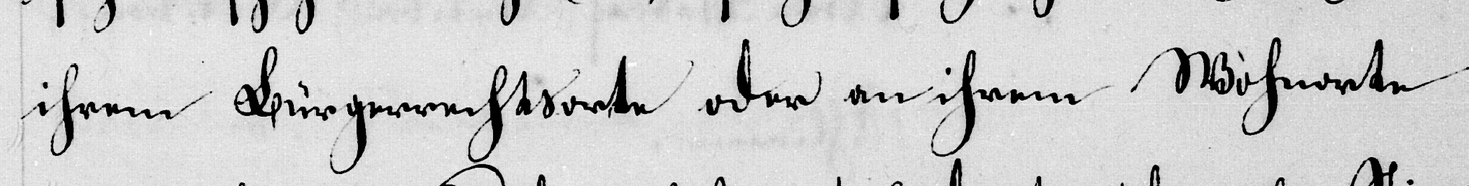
ihrem Bürgerrechtsorte oder an ihrem Wohnorte
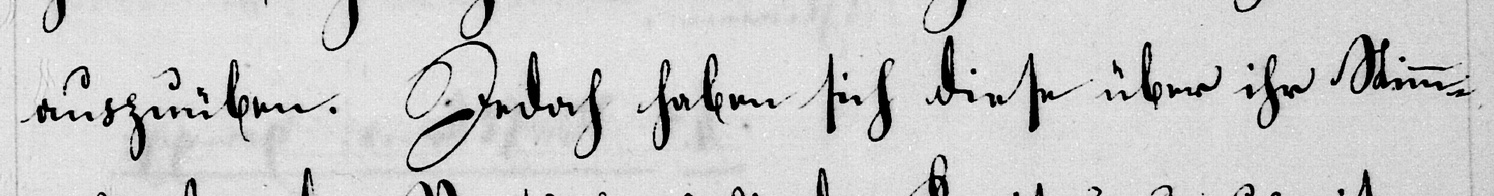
auszuüben. Jedoch haben sich diese über ihr Stimm¬
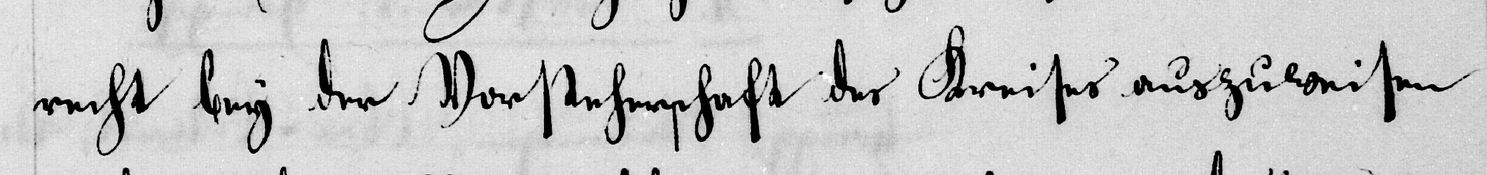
recht bey der Vorsteherschaft des Kreises auszuweisen
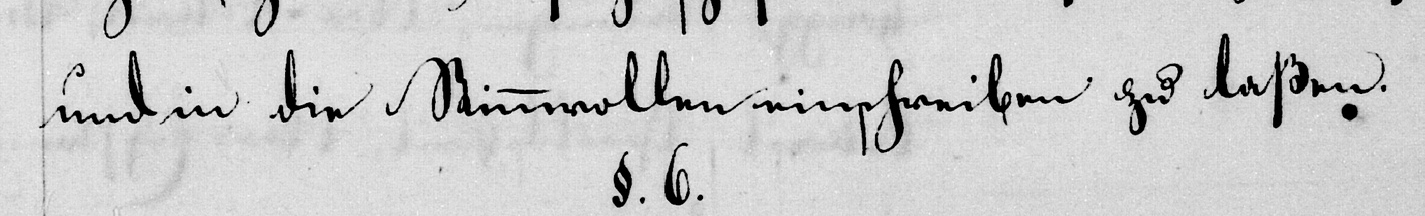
und in die Stimmrollen einschreiben zu laßen.
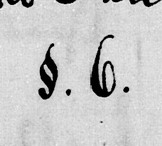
§.6.
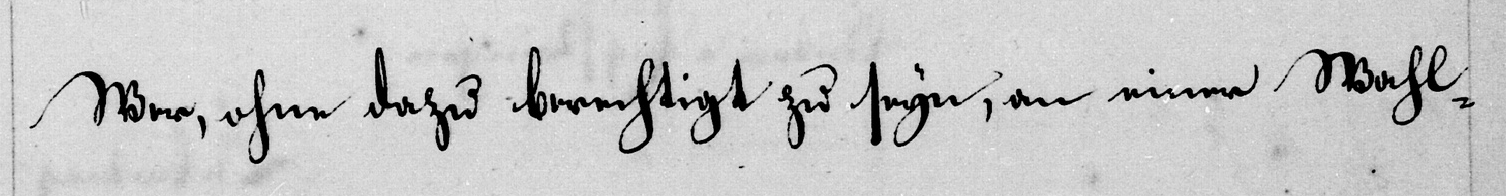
Wer, ohne dazu berechtigt zu seyn, an einer Wahl-
